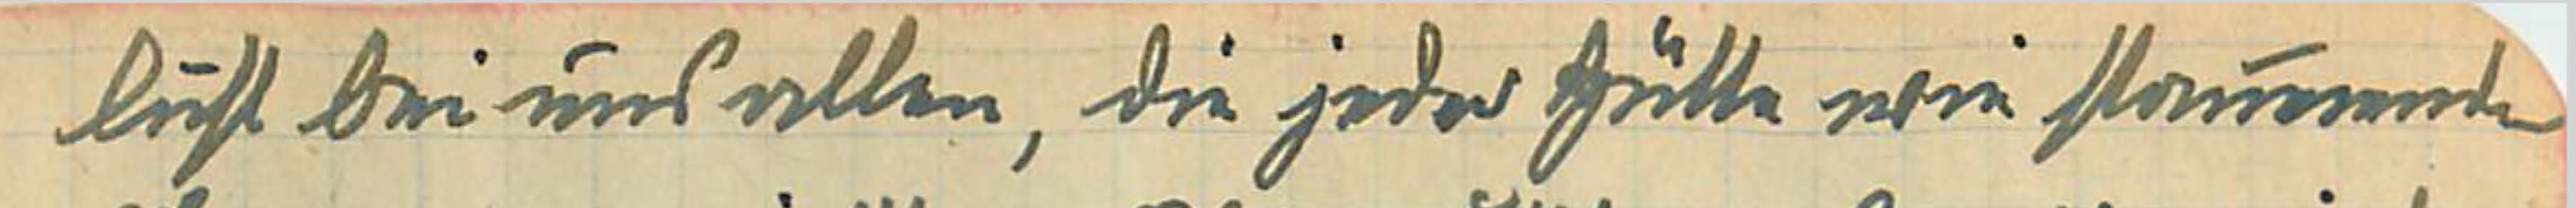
lust bei uns allen, die jeder Hütte wie staunender
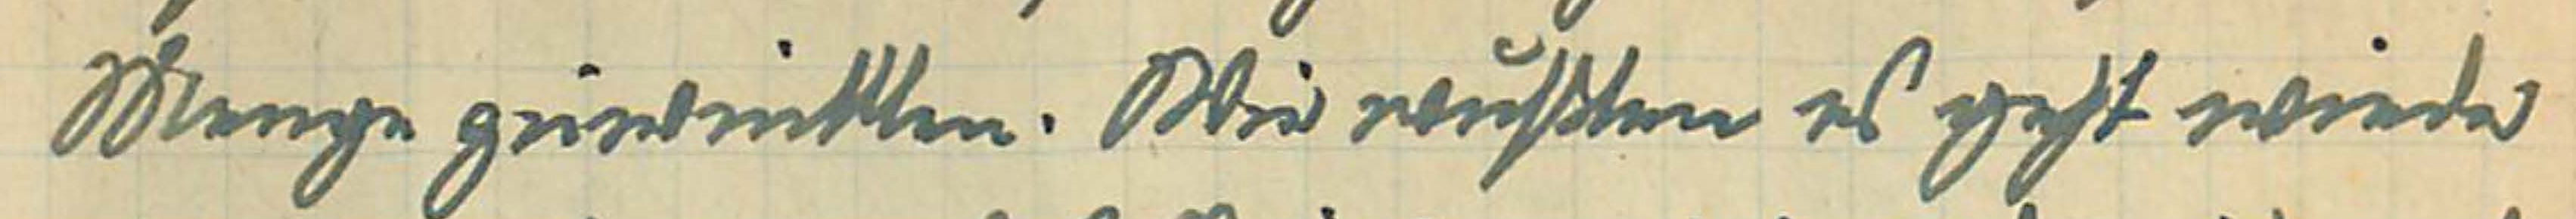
Menge zuwinkten. Wir wußten es geht wieder
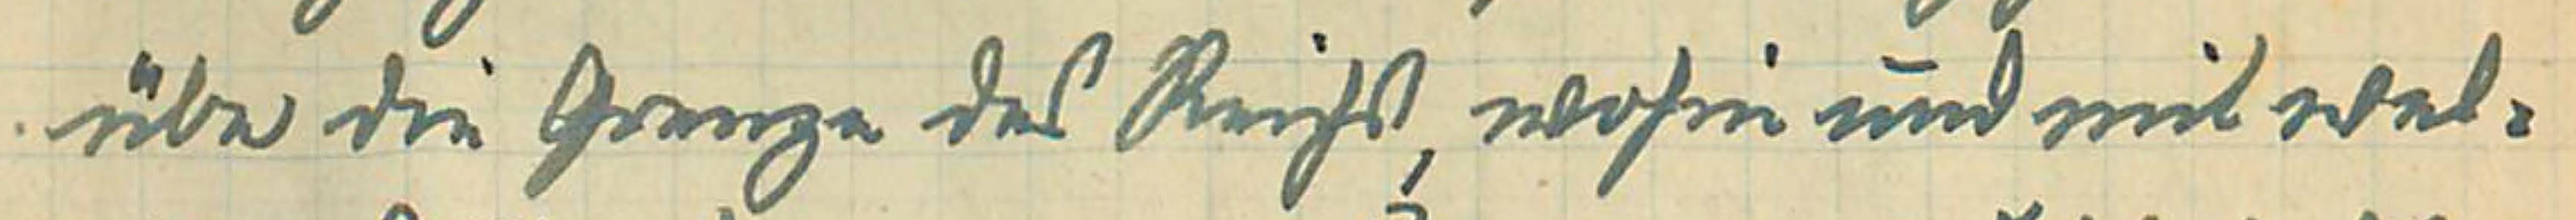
über die Grenze des Reichs, wohin und mit wel-
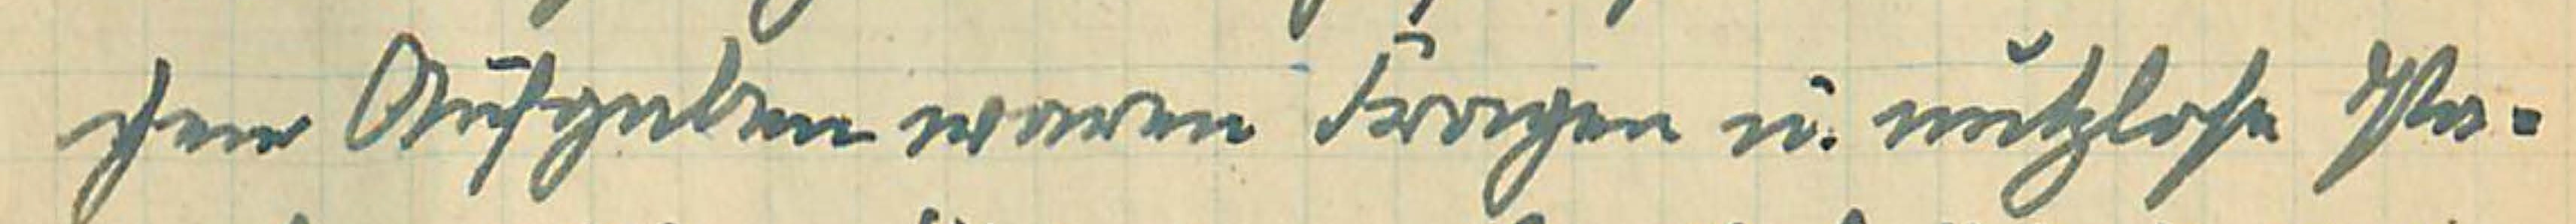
chen Aufgaben waren Fragen u. nutzlose Pa-
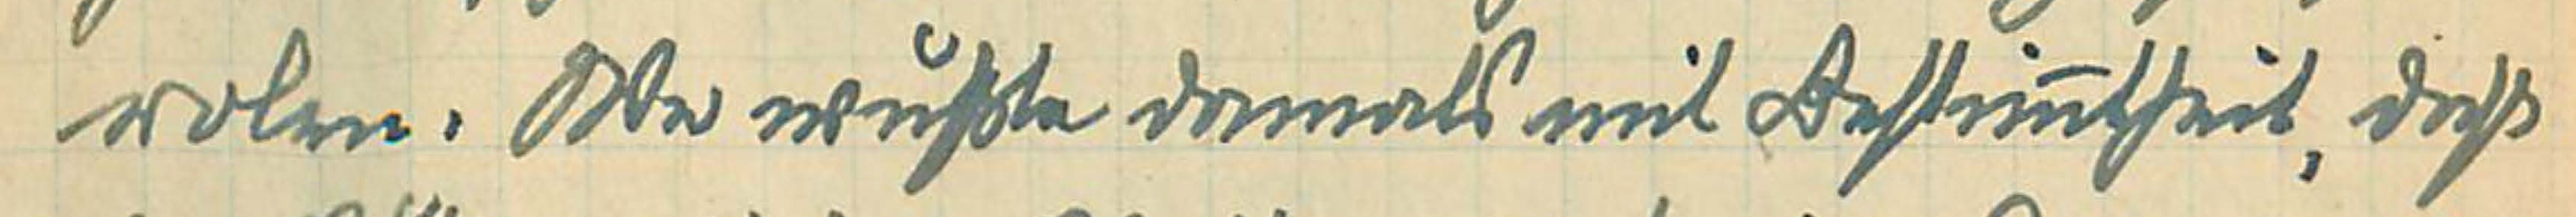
rolen. Wer wußte damals mit Bestimmtheit, daß
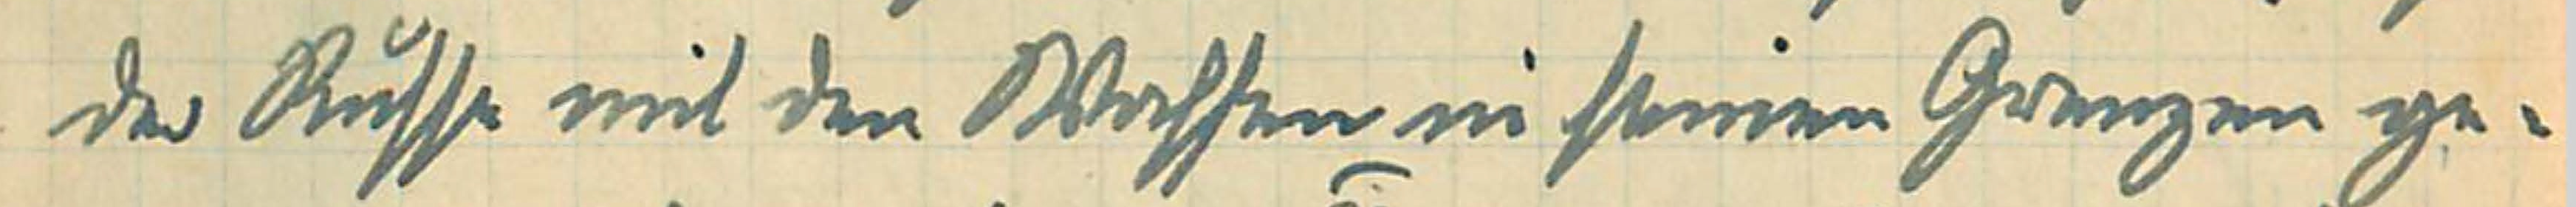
der Russe mit den Waffen in seinen Grenzen ge-
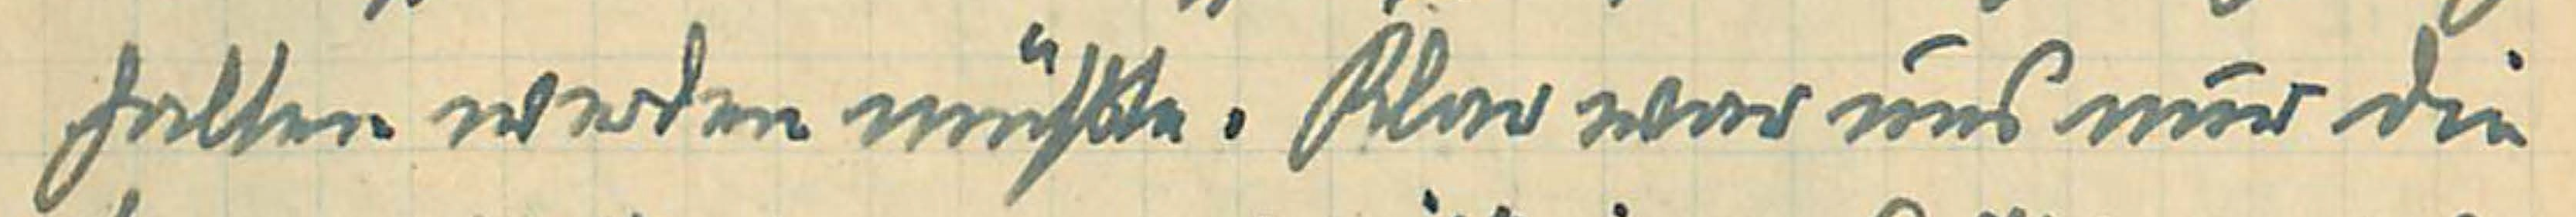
halten werden müßte. Klar war uns nur die
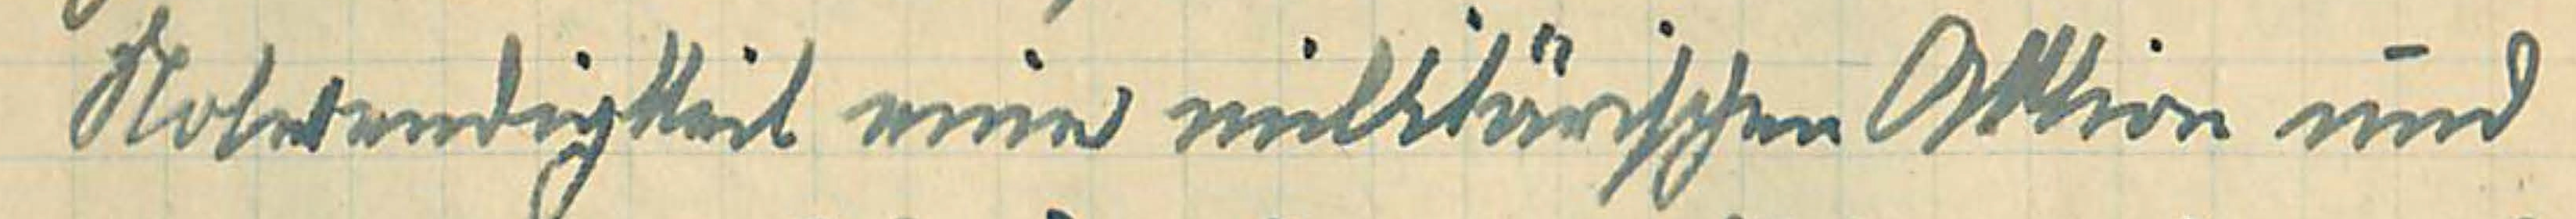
Notwendigkeit einer militärischen Aktion und
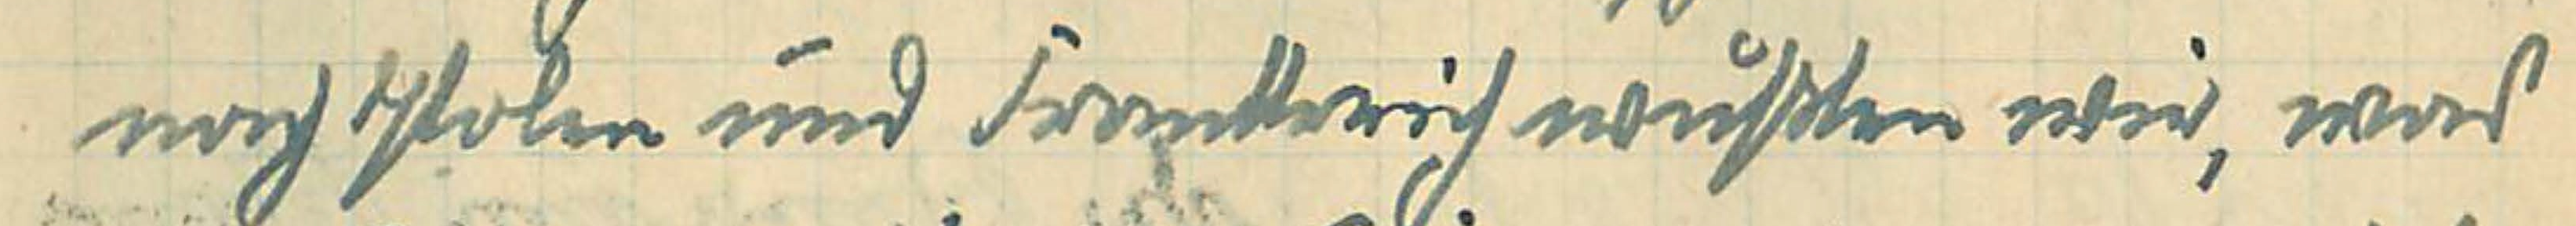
nach Polen und Frankreich wußten wir, was
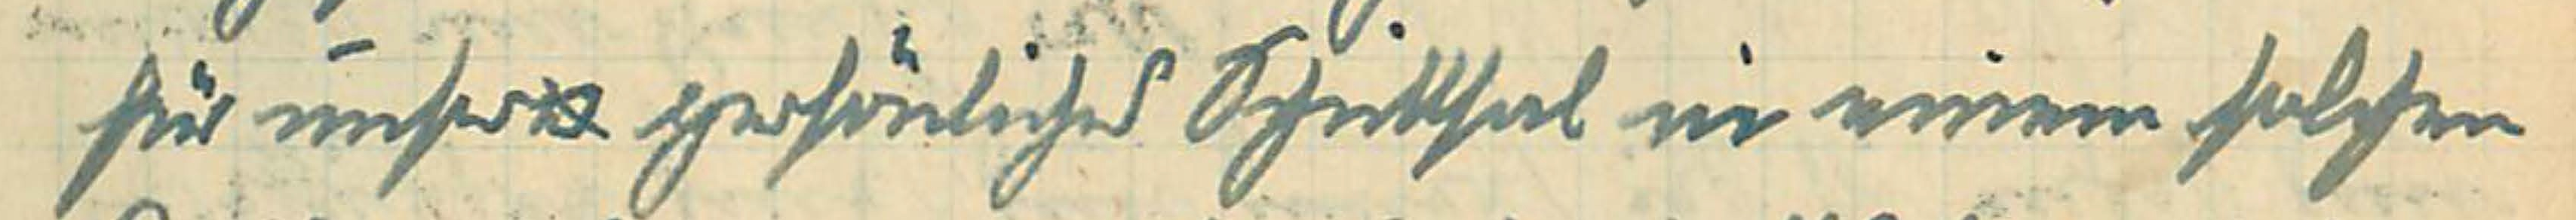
für unseren persönliches Schicksal in einem solchen
